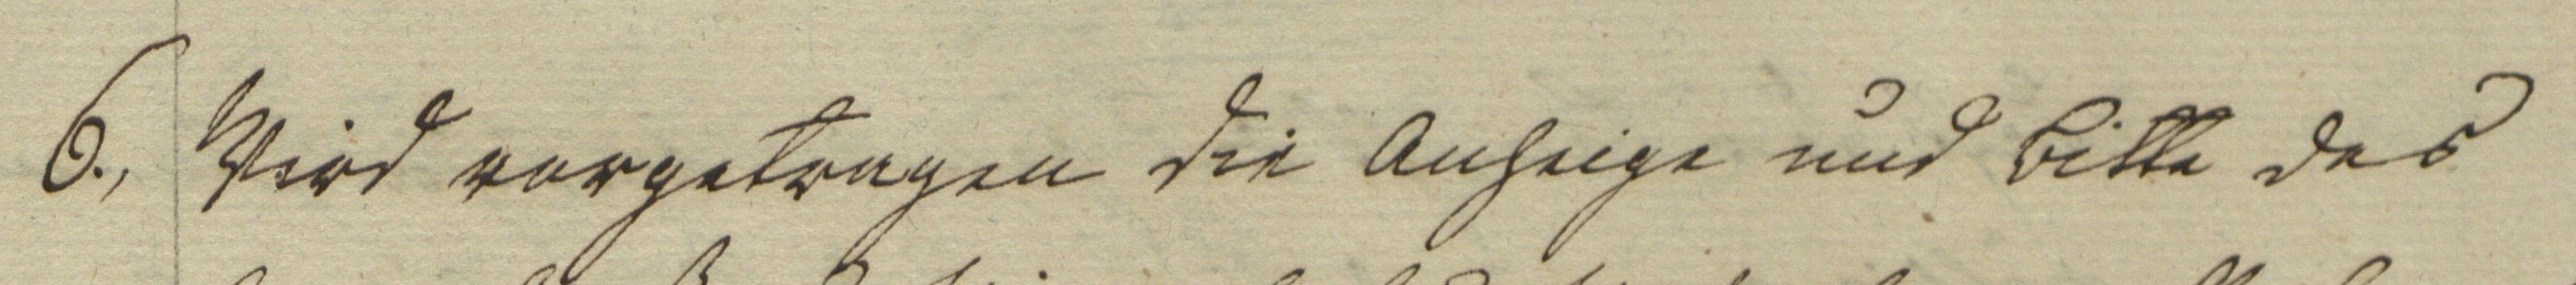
6., Wird vorgetragen die Anzeige und Bitte des
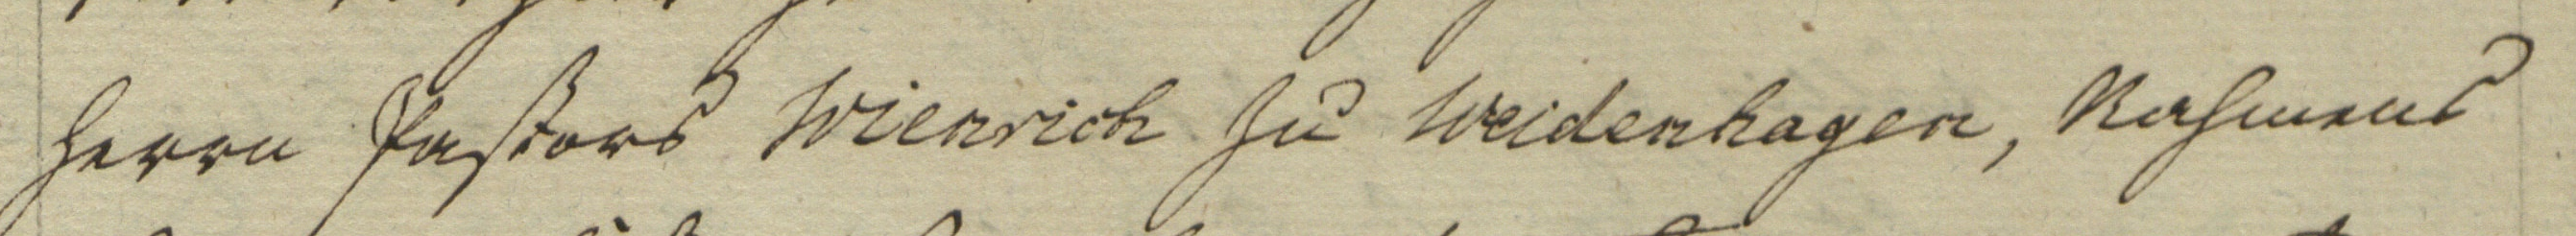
Herrn Pastors Wienrich zu Weidenhagen, Nahmens
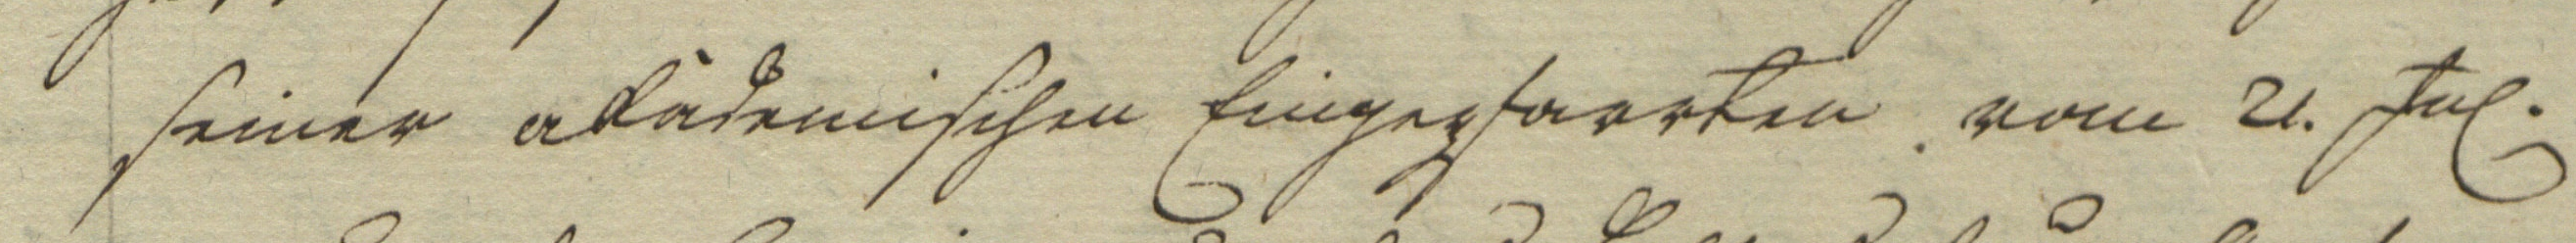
seiner akademischen Eingepfarrten vom 21. Jul.
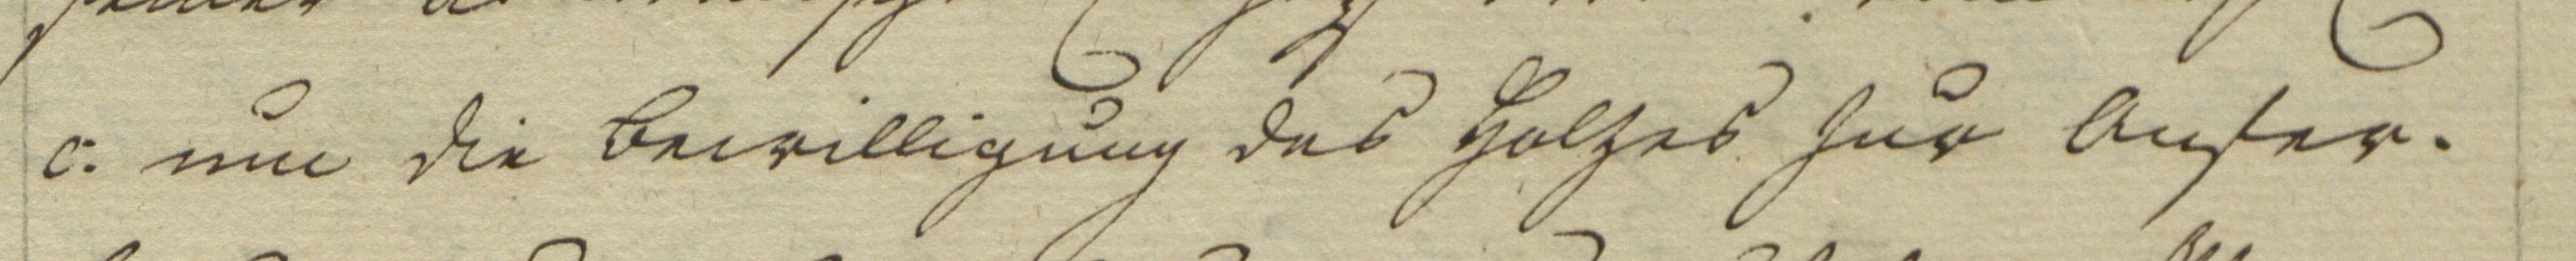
c. um die Bewilligung des Holzes zur Anfer¬
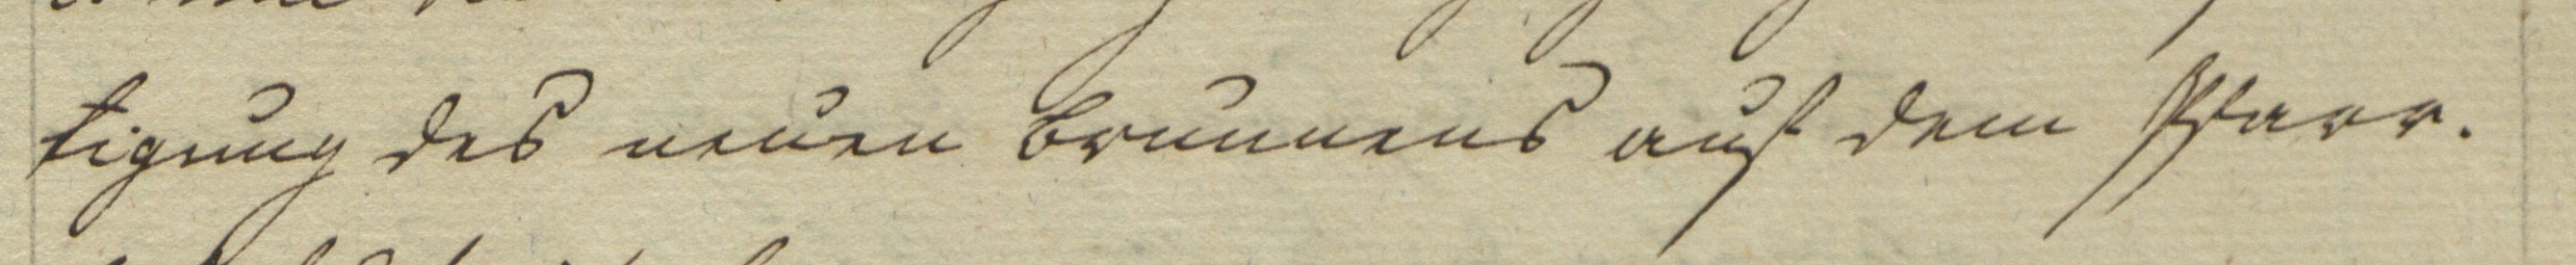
tigung des neuen Brunnens auf dem Pfarr¬
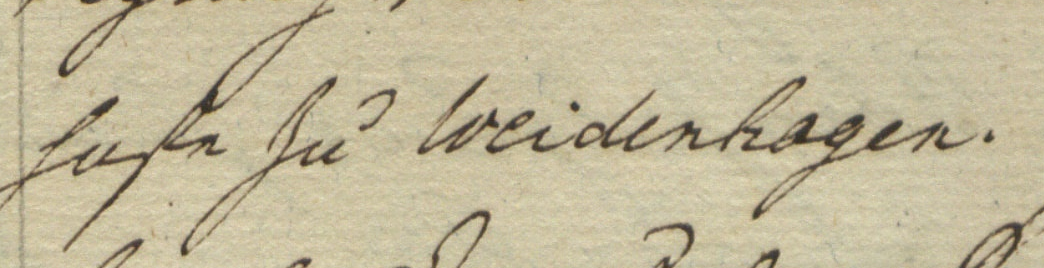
hofe zu Weidenhagen.
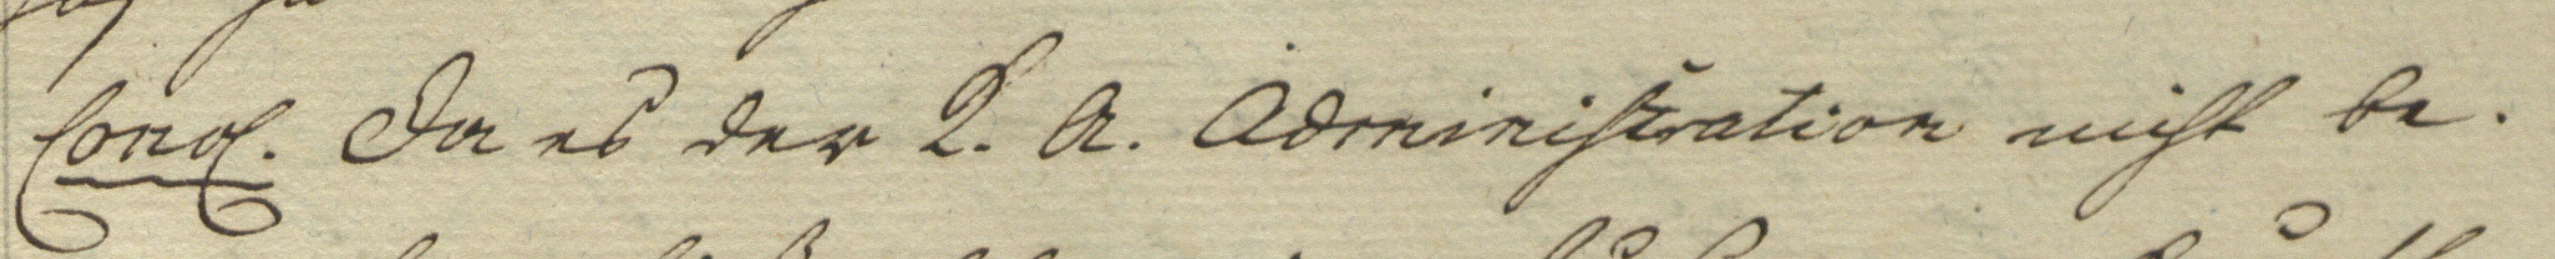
Concl. Da es der K. A. Administration nicht be¬
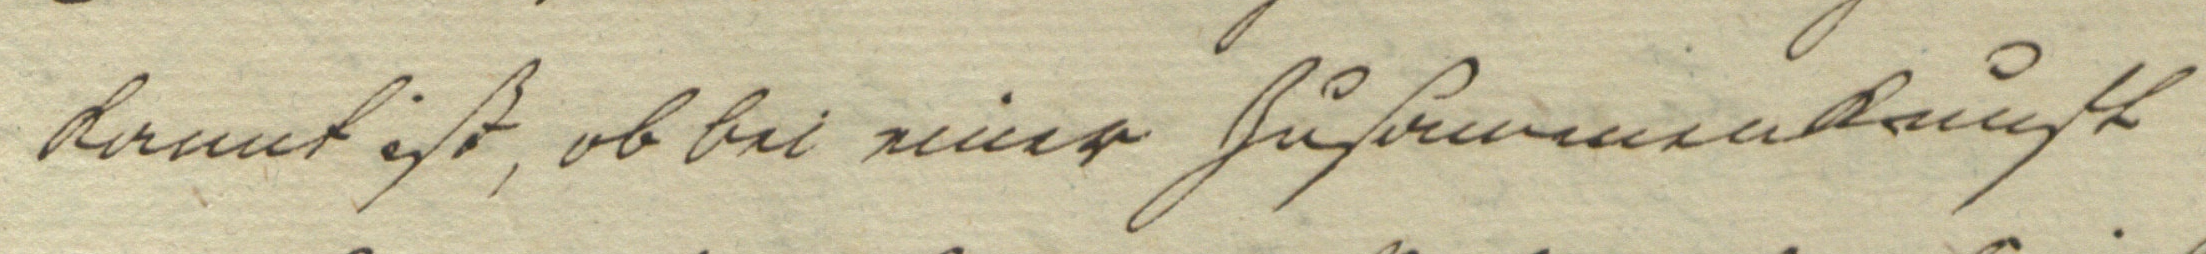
kannt ist, ob bei einer Zusammenkunft
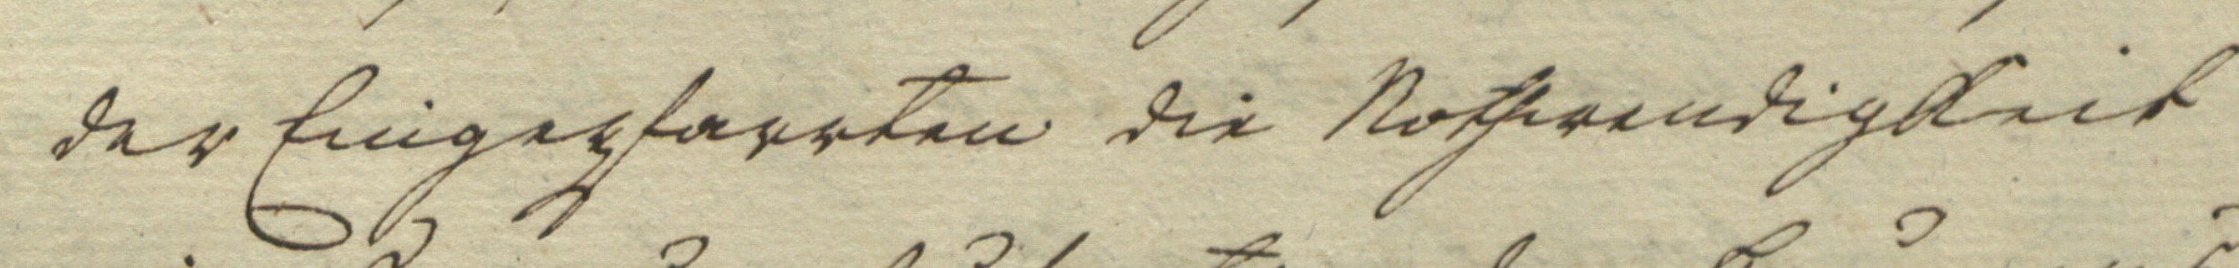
der Eingepfarrten die Nothwendigkeit
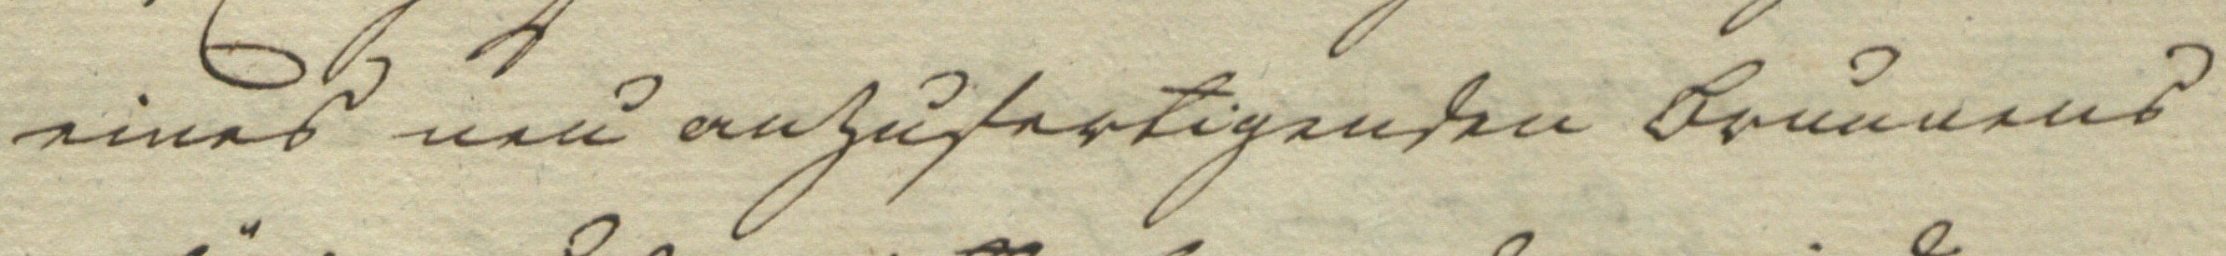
eines neu anzufertigenden Brunnens
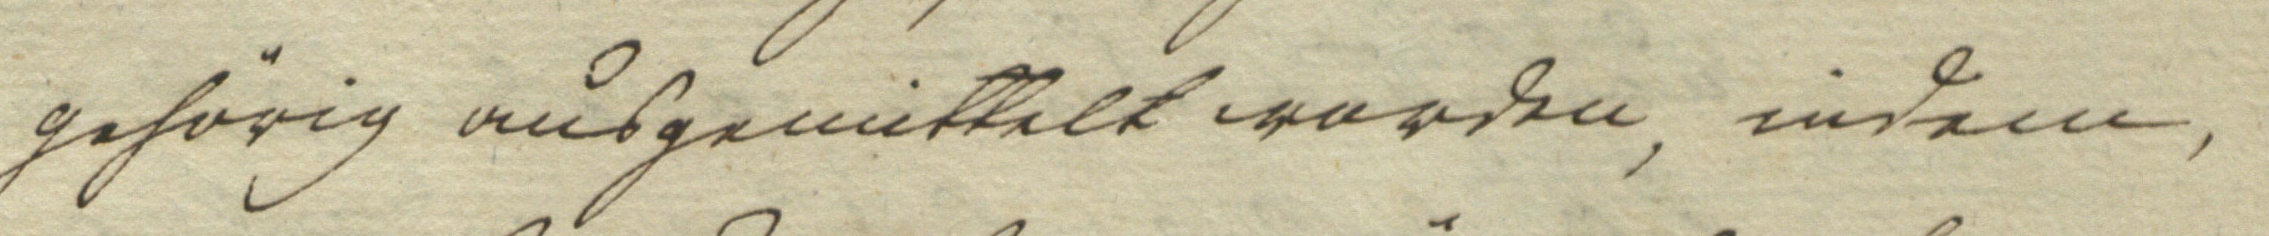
gehörig ausgenmittelt worden, indem,
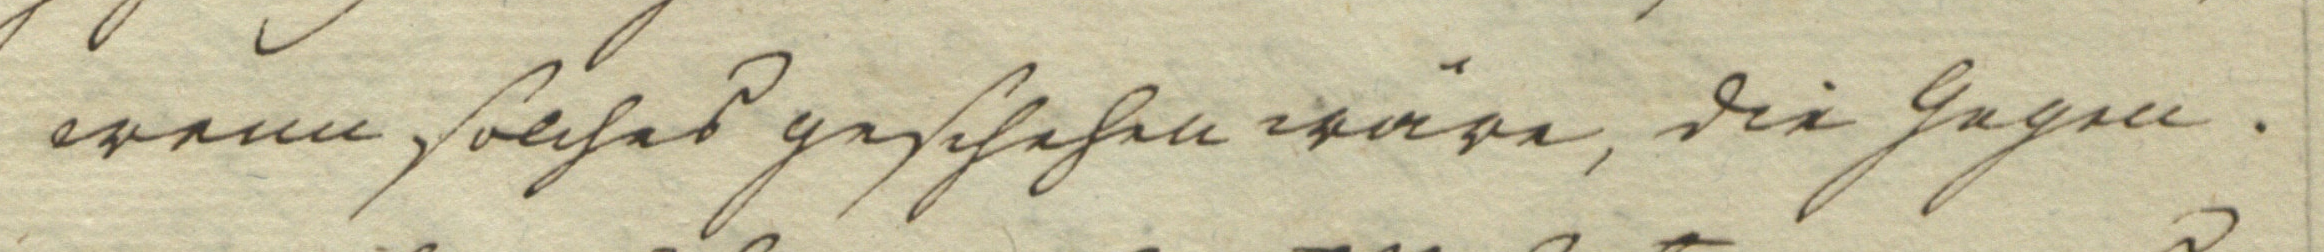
wenn solches geschehen wäre, die Gegen¬
